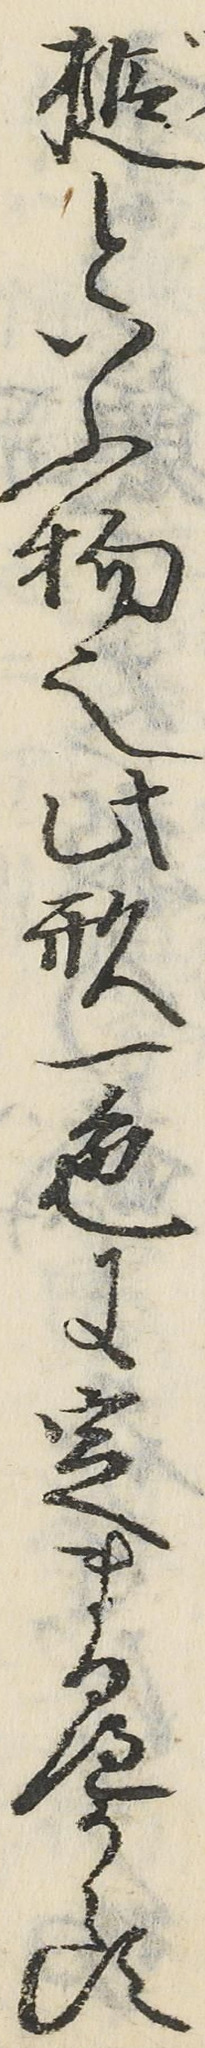槌といふ物の此形一色に定まるへからす
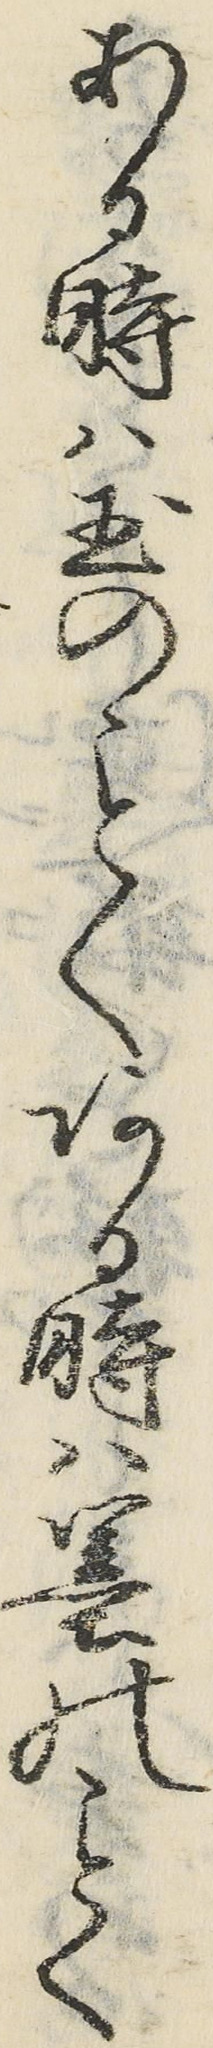ある時は玉のことくある時は墨のことく
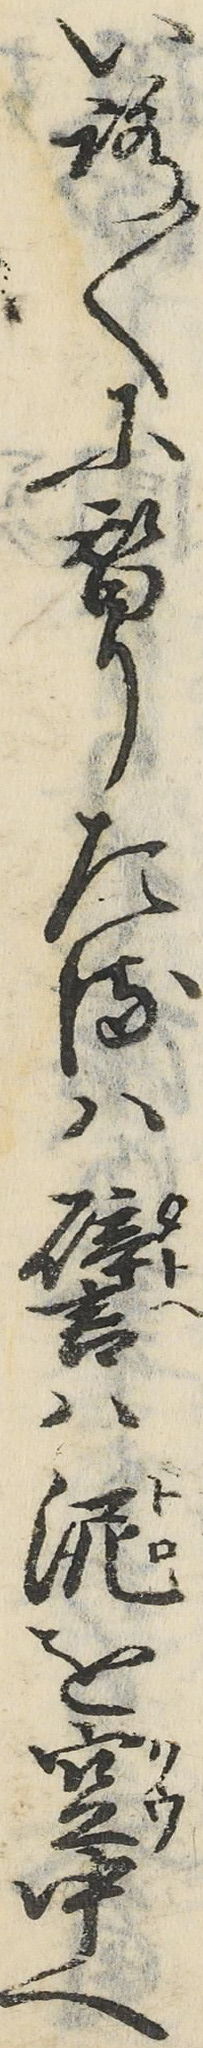いろ〳〵に替りたるは譬は泥を空中へ

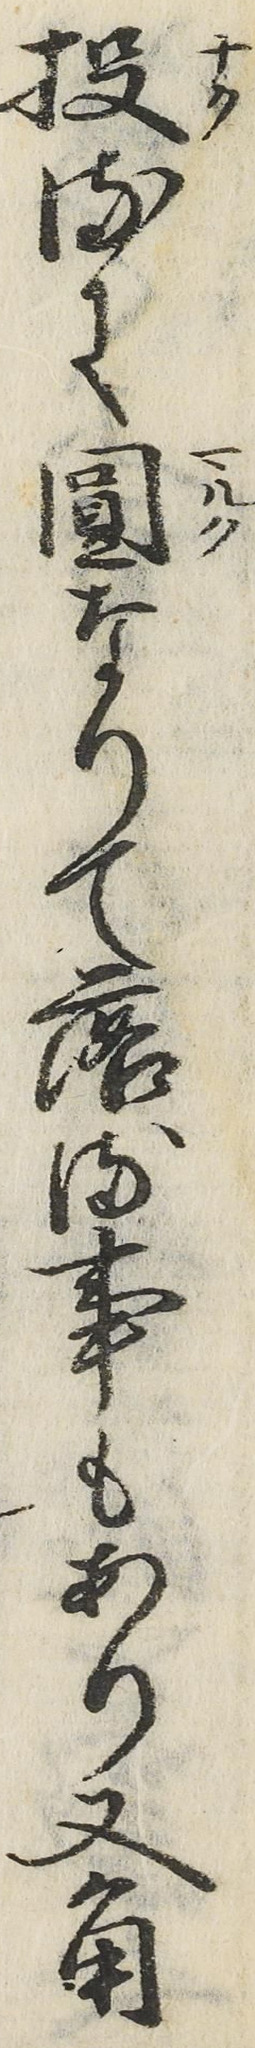投るに円なりて落る事もあり又角
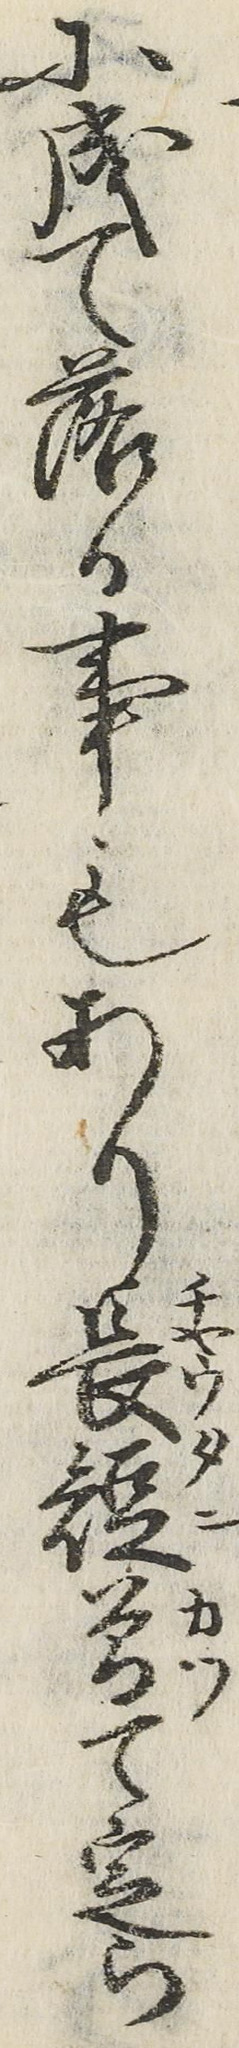に成て落る事もあり長短嘗て定ら
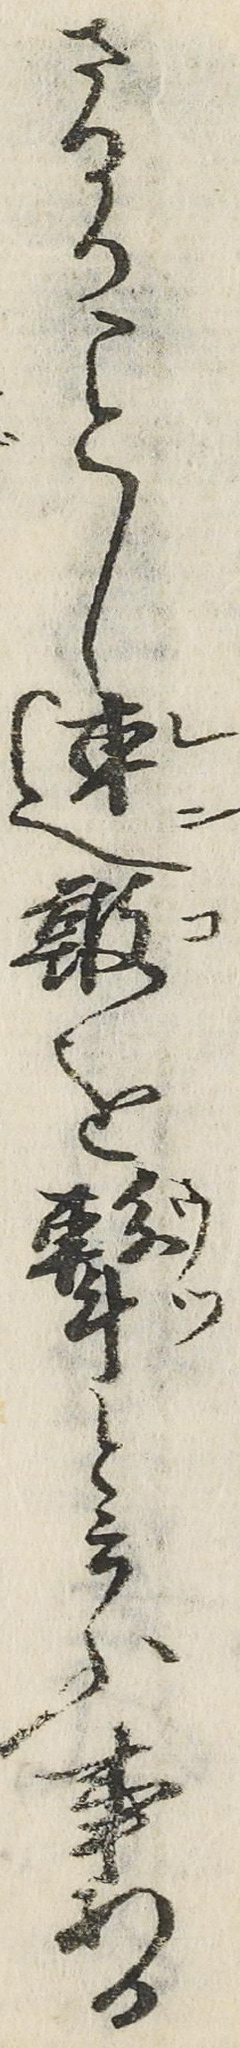さるかことし連鼓を撃と云ふ事ある
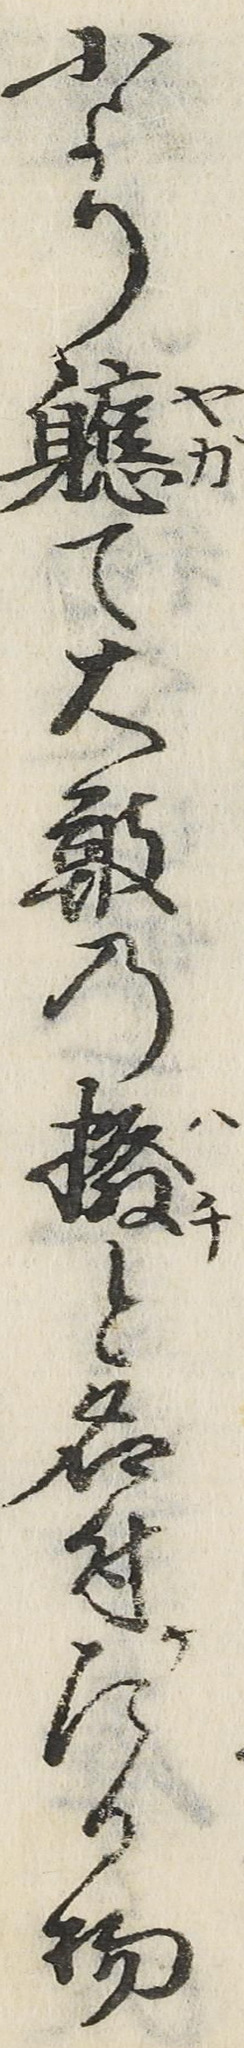により軈て大鼓の撥と名付けたる物
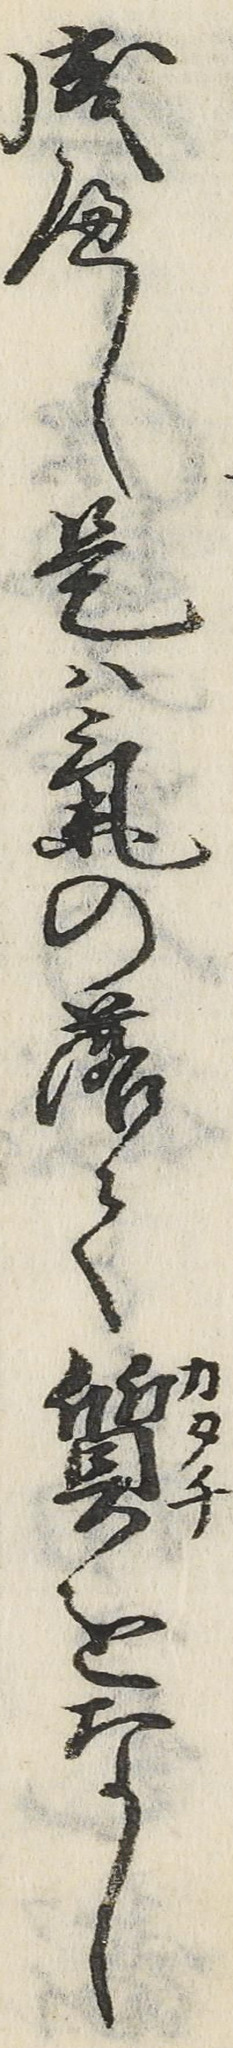成へし是は気の落て質をなし
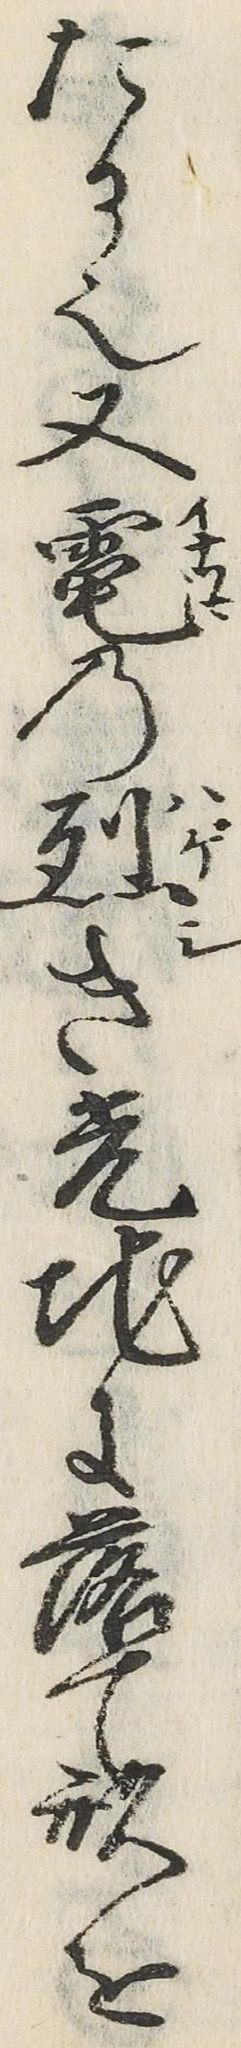たる也又電の烈き光地に落て形を
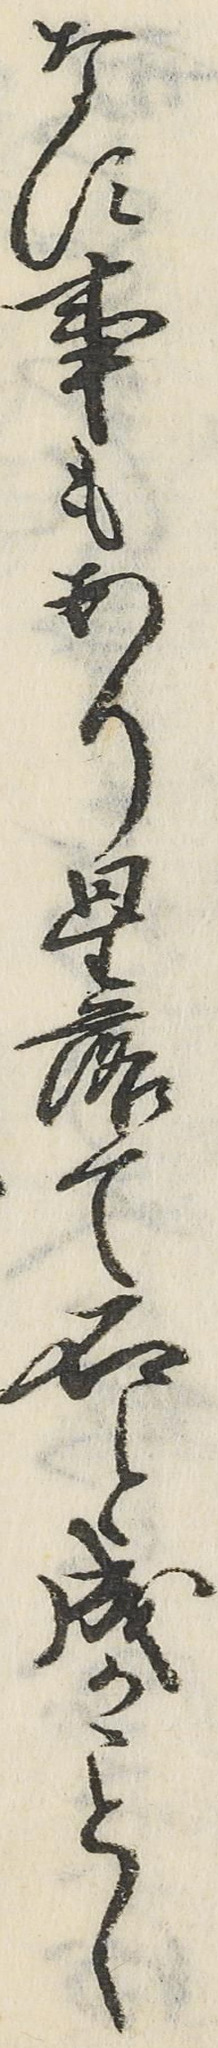なす事もあり星落て石と成かことし
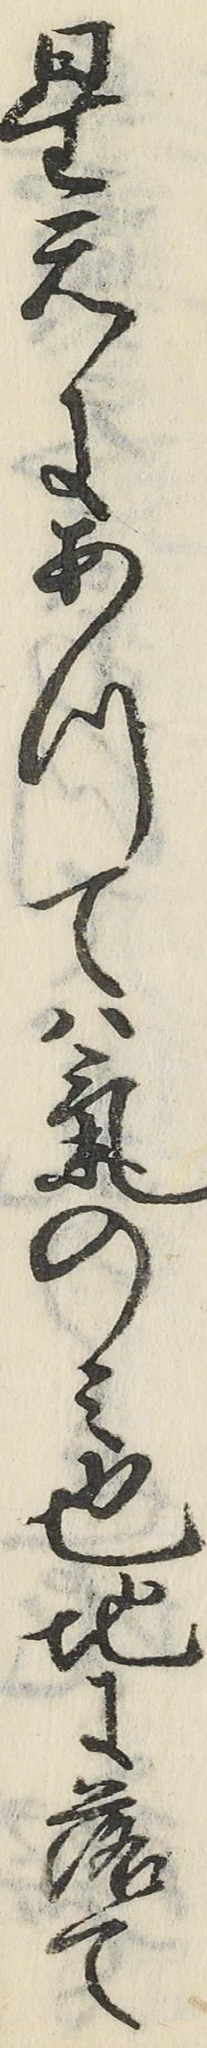星天にあつては気のみ也地に落て
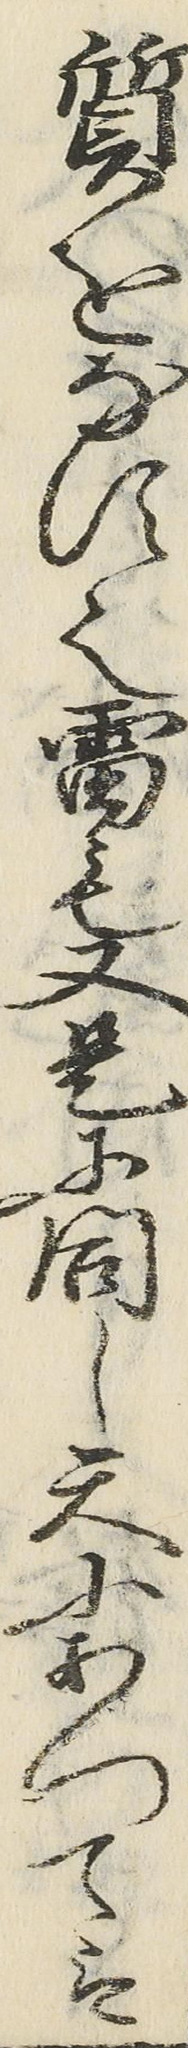質をなす也雷も又是に同し天にあつては
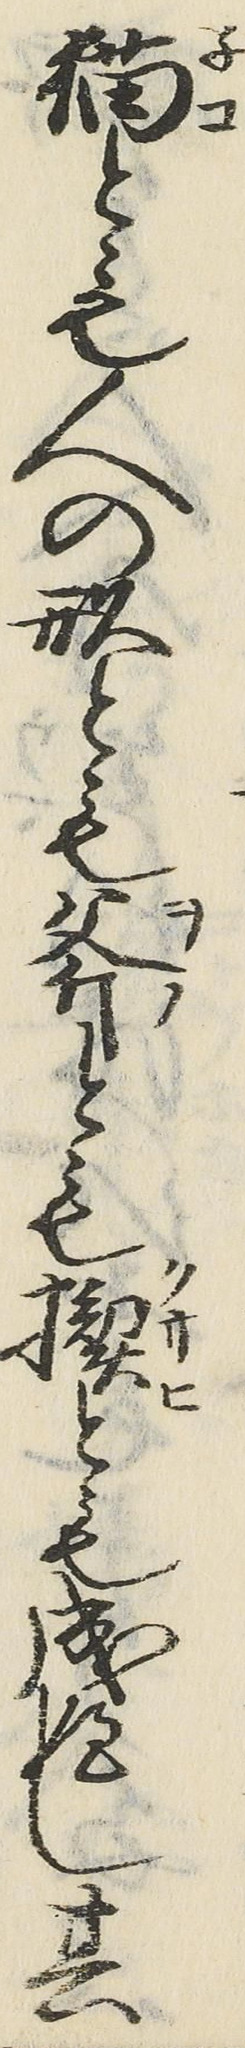猫とも人の形とも斧とも楔とも成へし其
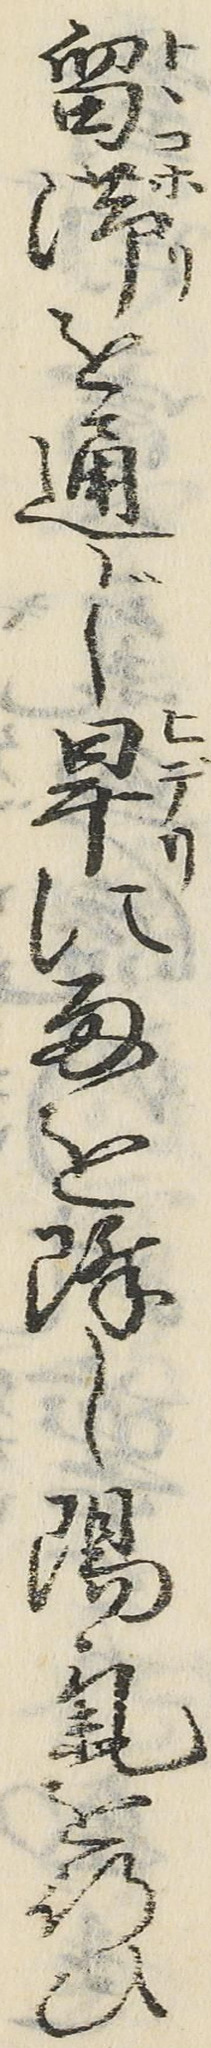留滞を通じ旱に雨を降し陽気を行ひ
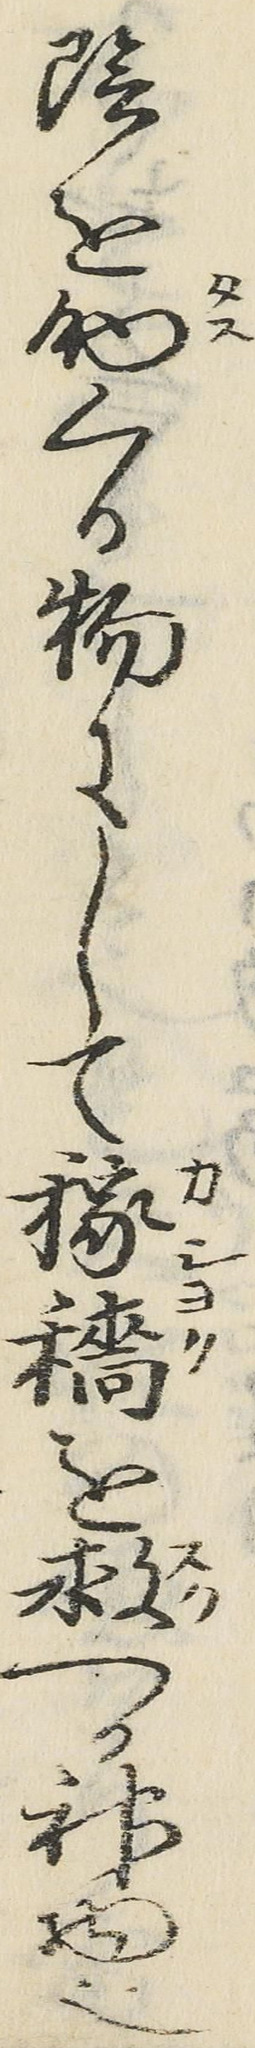陰を助くる物にして稼穡を救へる神物也
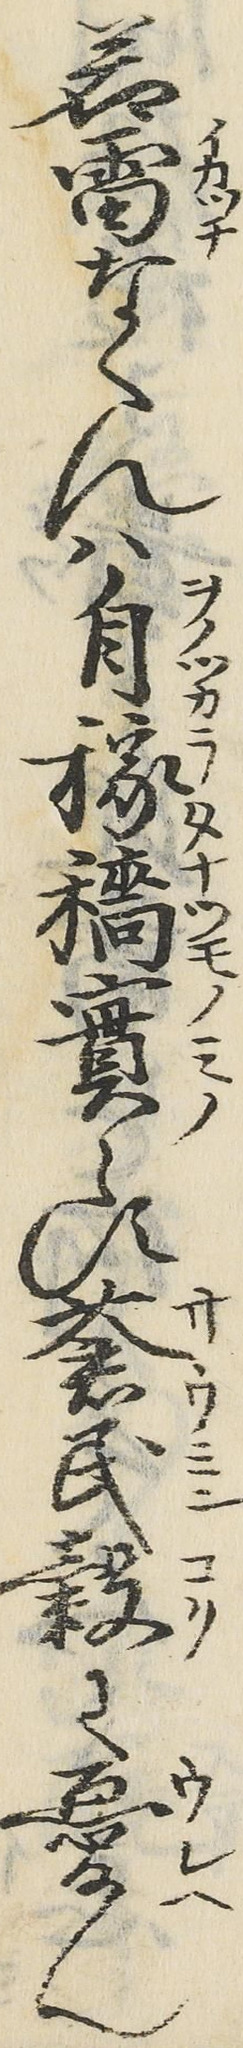若雷なくんは自稼穡実らす蒼民穀に憂ん
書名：天地或問珍　天
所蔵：東京大学地震研究所図書室 Earthquake Research Institute Library, The University of Tokyo, JAPAN
